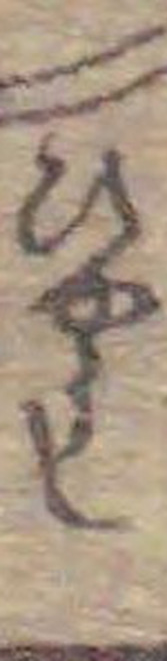ひやうし
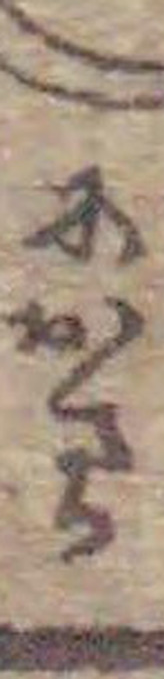におさか
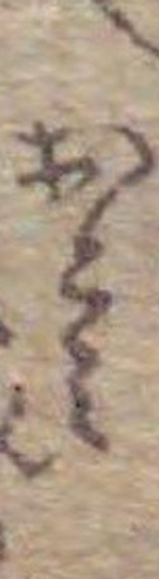おとみ
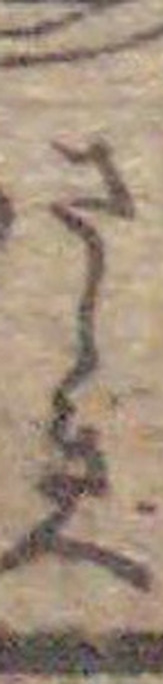さしきへ
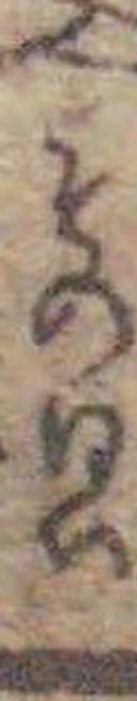その日は
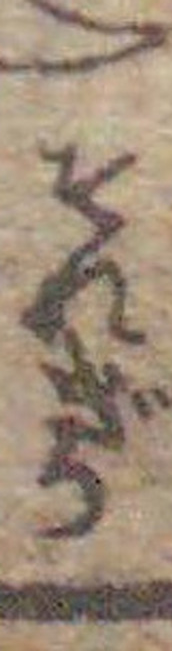それぎり

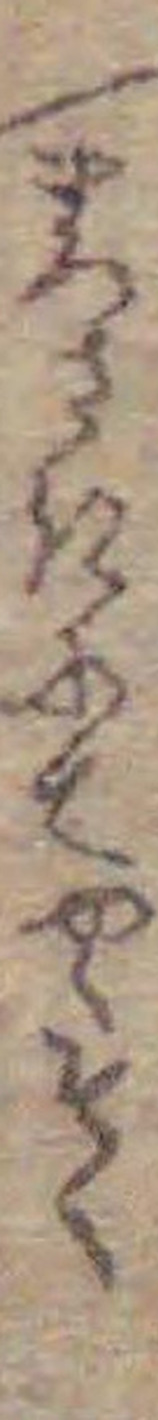まつさきにてやくそく
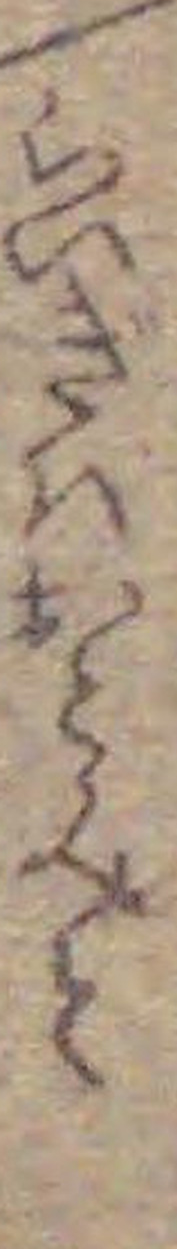らいぎはおとみと
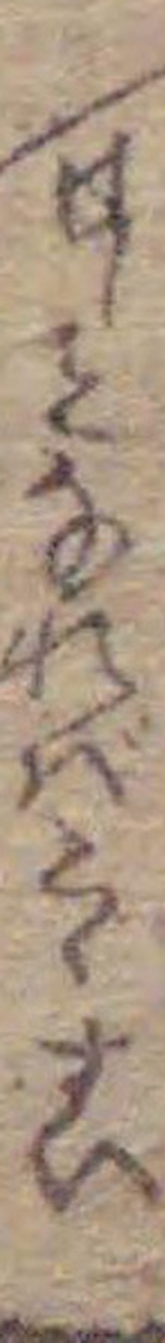せしことなればこくすい
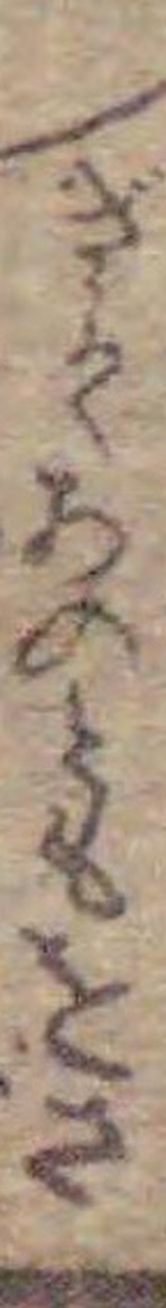ぎよくあのともをさ
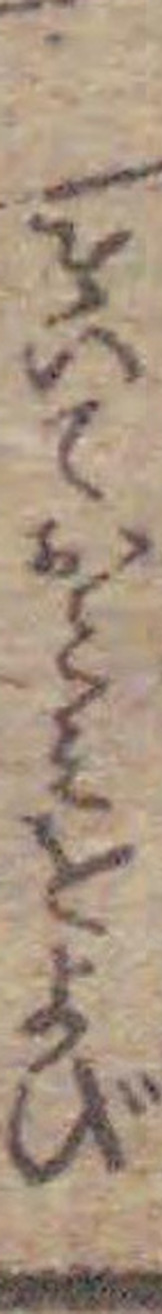そいておとみをよび
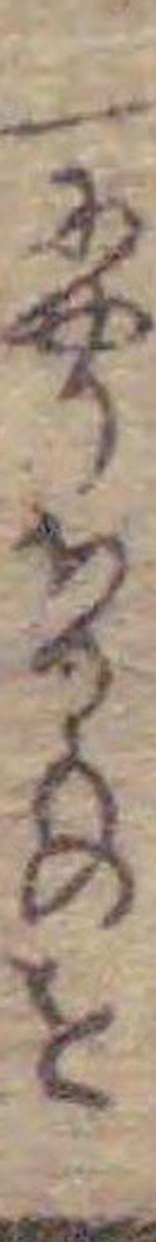にやりほりものを
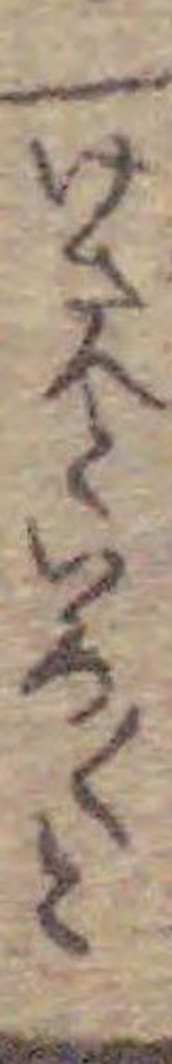けさんといろ〳〵と
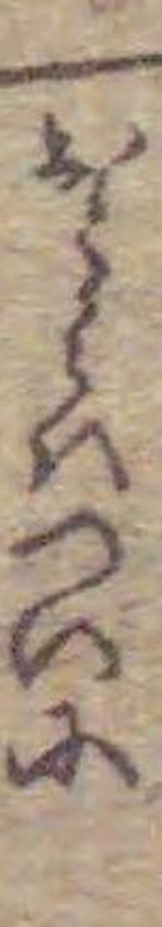おとみはついに
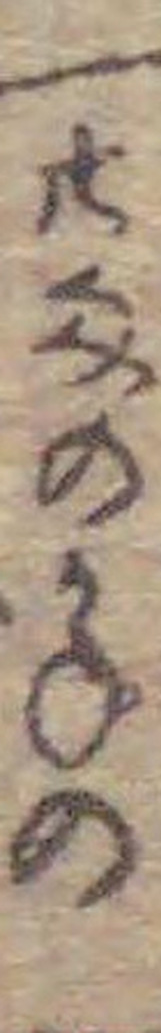廿両のかねの
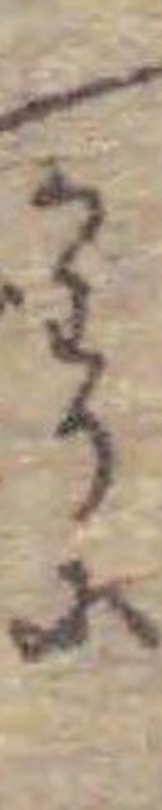かわりに
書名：芸者呼子鳥 : 2巻（松泉堂）
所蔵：国立国会図書館 National Diet Library, JAPAN
